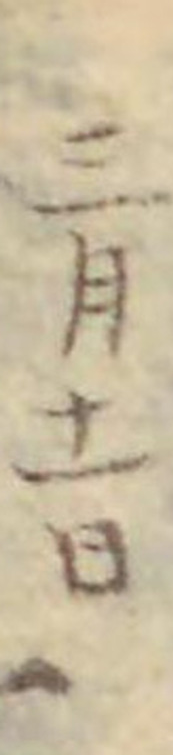三月十一日
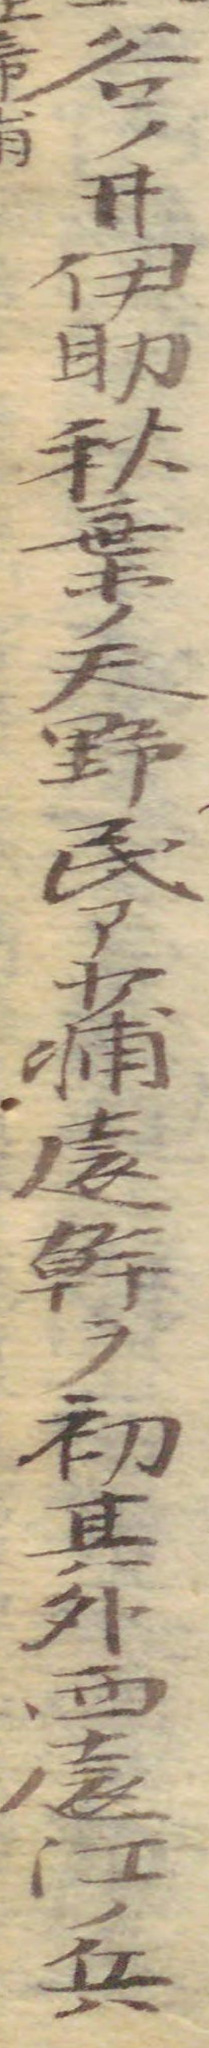谷ノ井伊助秋葉ノ天野民部少輔遠幹ヲ初其外西遠江ノ兵
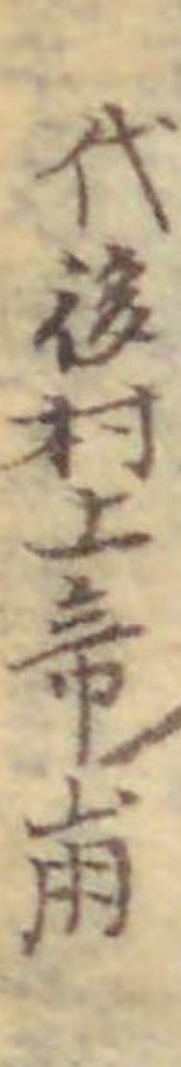代後村上帝崩

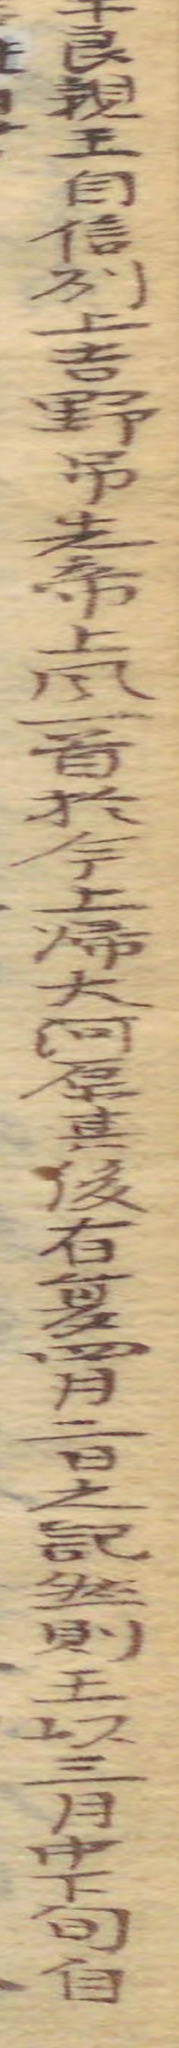宇良親王自信州上吉野吊先帝上風一首於今上帰大河原其後有夏四月二日之記然則王以三月中下旬自
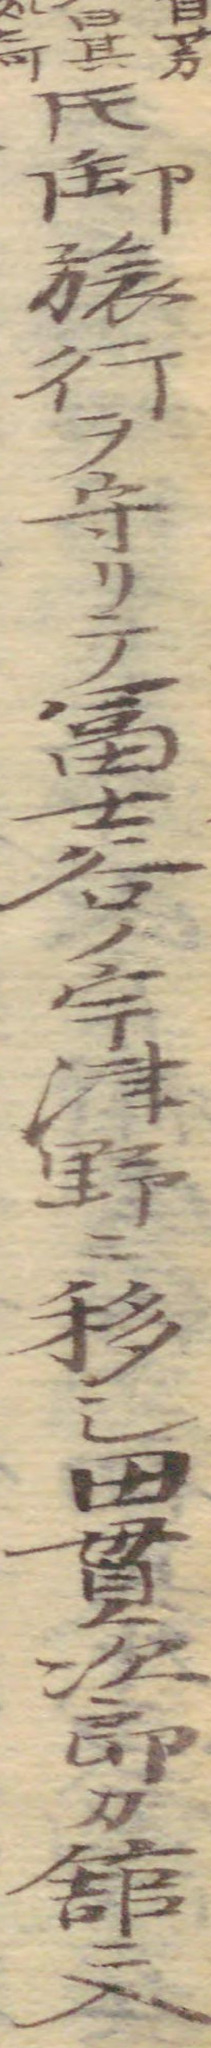トモ旅行ヲ守リテ冨士谷ノ宇津野ニ移シ田貫次郎カ館ニ入
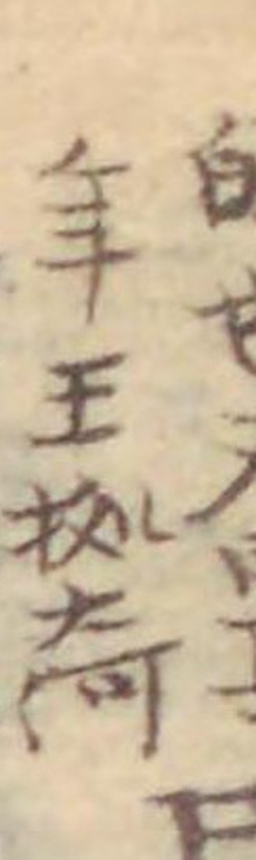年王拠大河
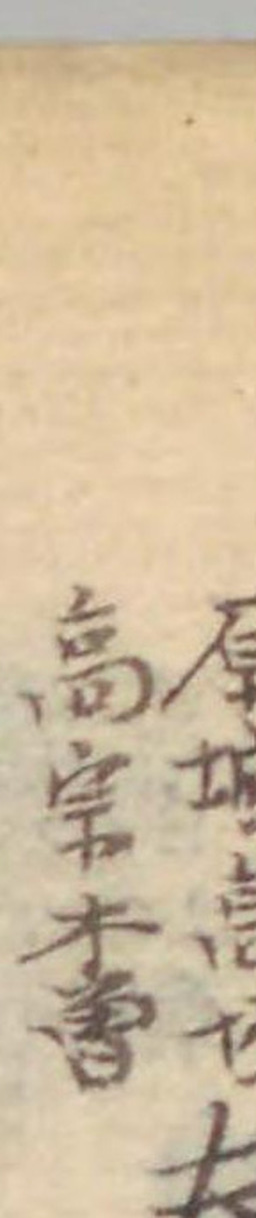高宗木曽
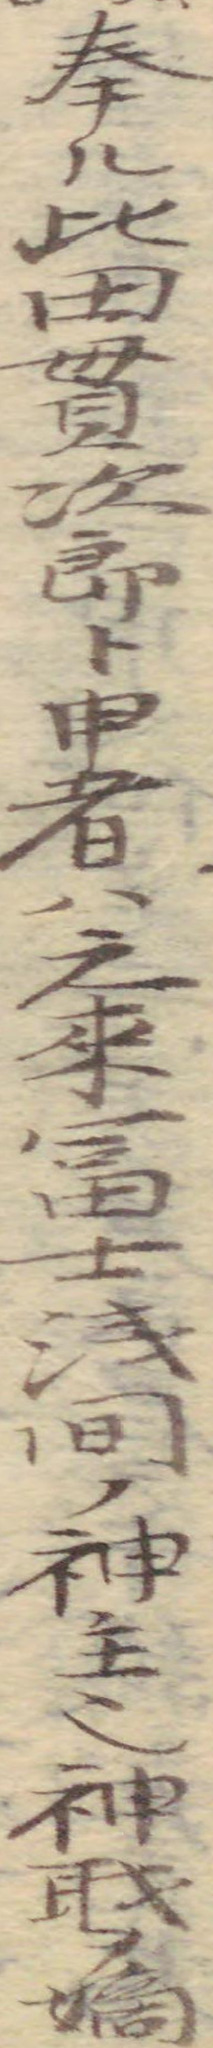奉ル此田貫次郎ト申者ハ元来冨士浅間ノ神主也神職ヲ嫡
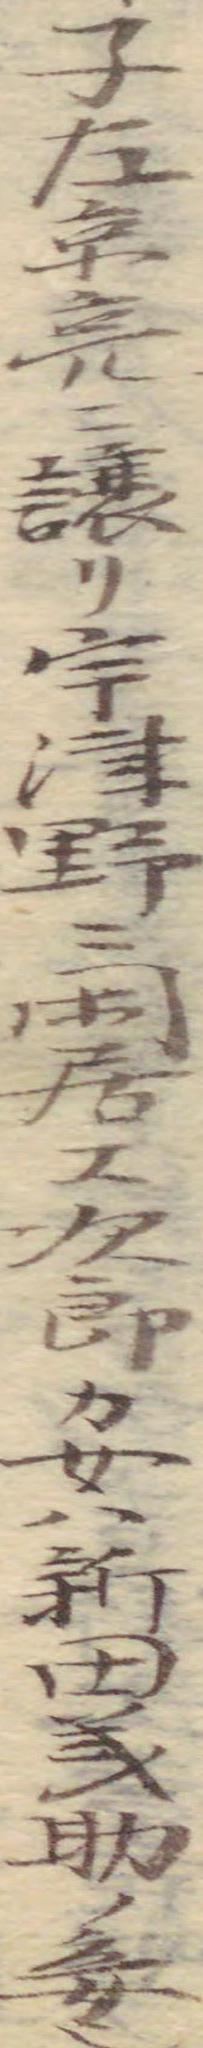子左京亮ニ譲リ宇津野ニ閑居ス次郎カ女ハ新田義助ノ妾也
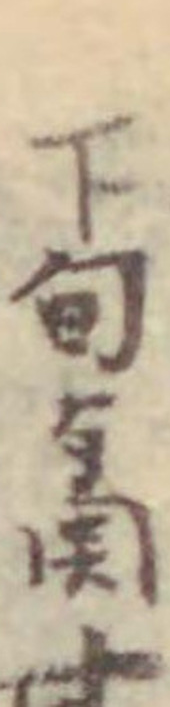下旬ゟ関
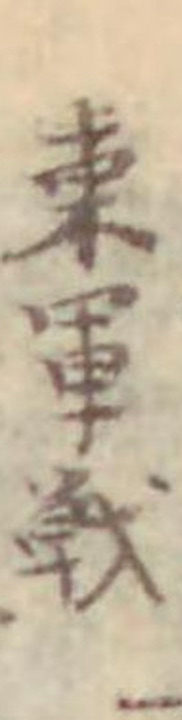東軍戦
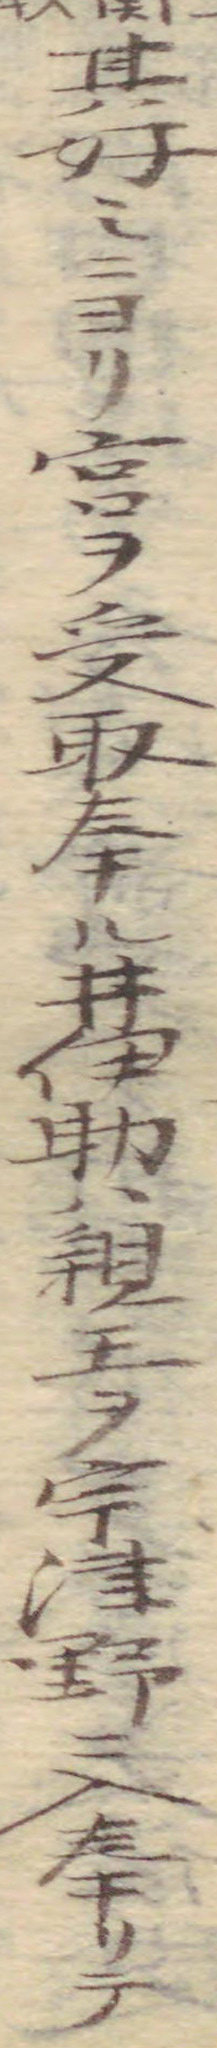其好ミニヨリ宮ヲ受取奉ル井伊助ハ親王ヲ字津野ニ入奉リテ
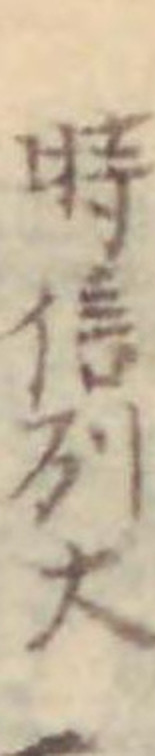時信州大
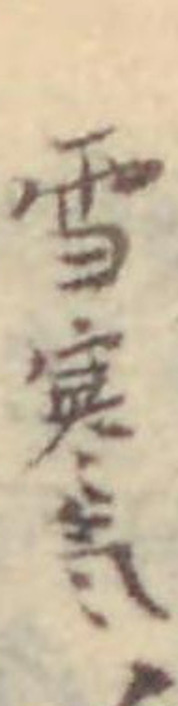雪寒気
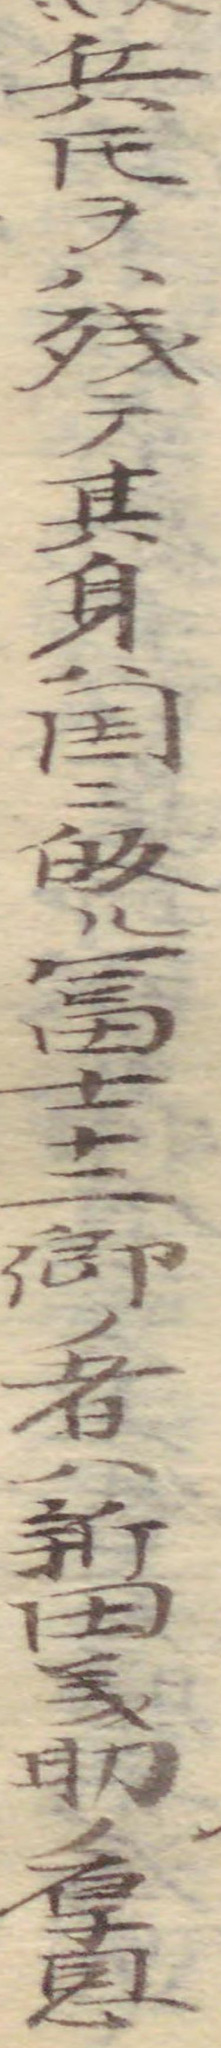兵トモヲハ残テ其身ハ国ニ皈ル冨士十二郷ノ者ハ新田義助ノ厚恩
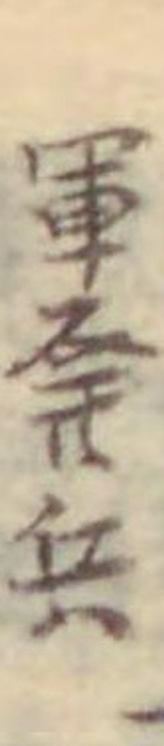軍発兵
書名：鶯宿雑記. 巻199-200
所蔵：国立国会図書館 National Diet Library, JAPAN
